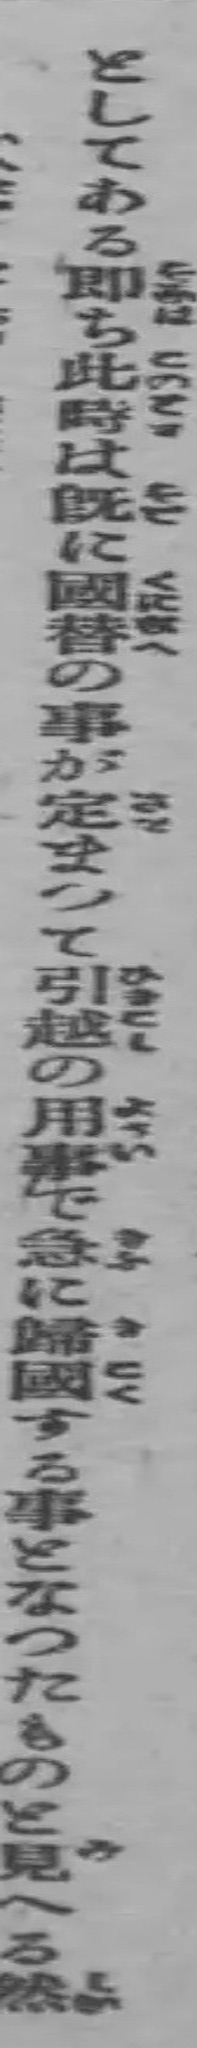としてある即ち此時は既に国替の事が定まつて引越の用意で急に帰国する事となつたものと見へる然
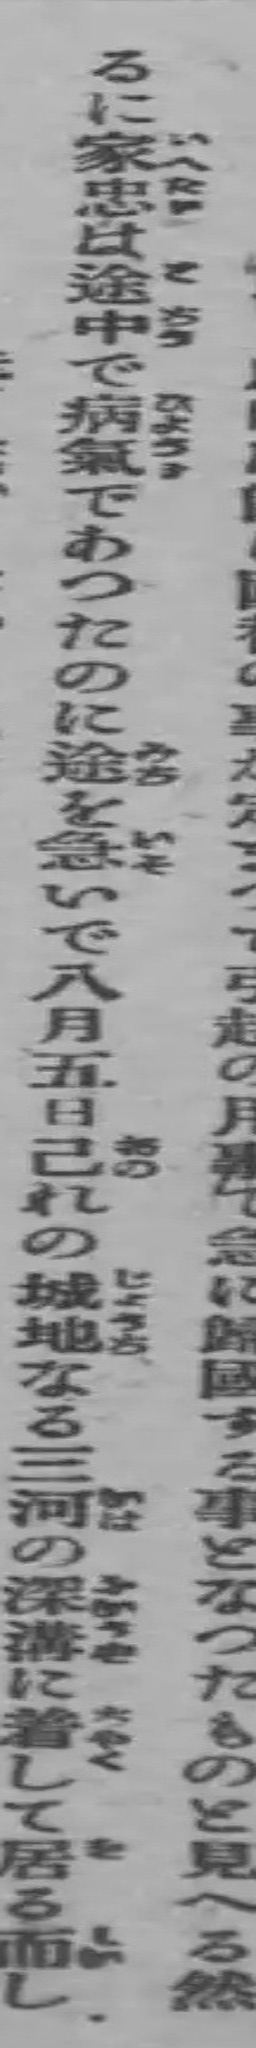るに家忠は途中で病気であつたのに途を急いで八月五日己れの城地なる三河の深溝に着して居る而し
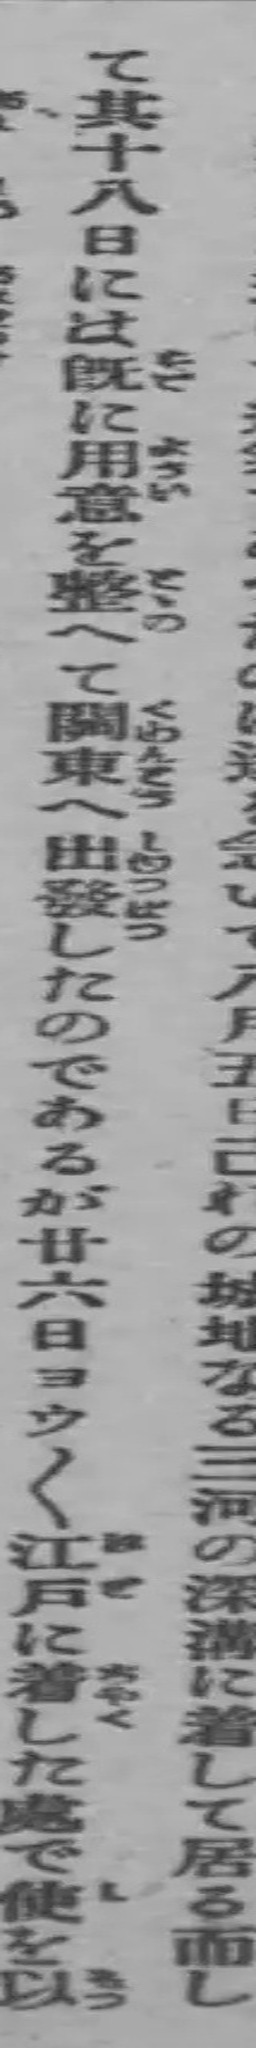て其十八日には既に用意を整へて関東へ出発したのであるが廿六日ヨウ〳〵江戸に着した処で使を以
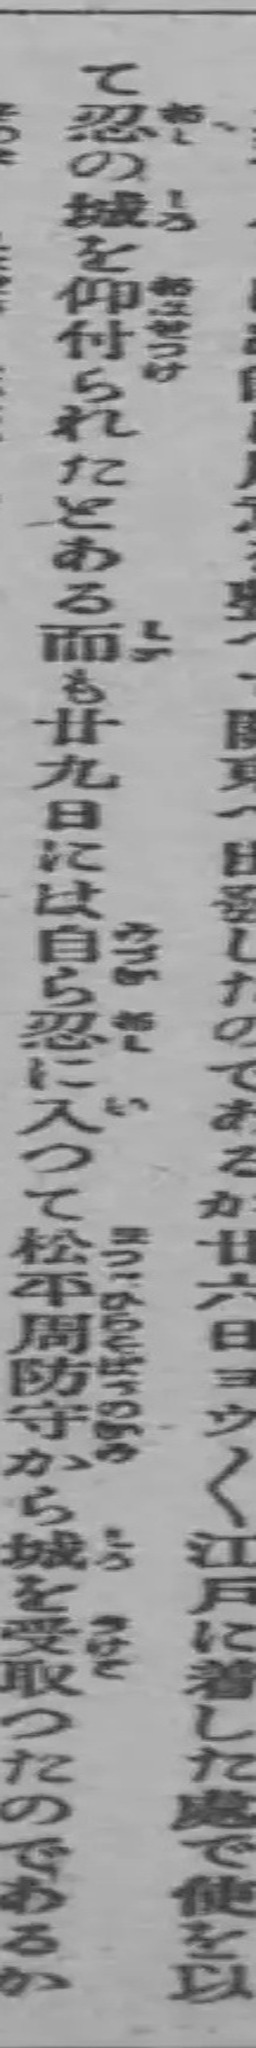て忍の城を仰付られたとある而も廿九日には自ら忍に入つて松平周防守から城を受取つたのであるか
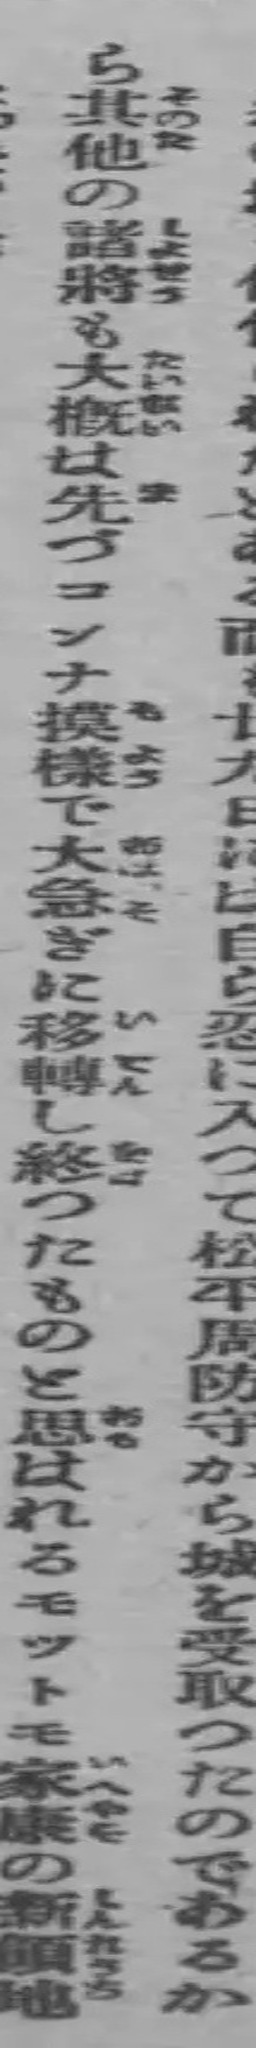ら其他の諸将も大概は先づコンナ模様で大急ぎに移転し終つたものと思はれるモツトモ家康の新領地
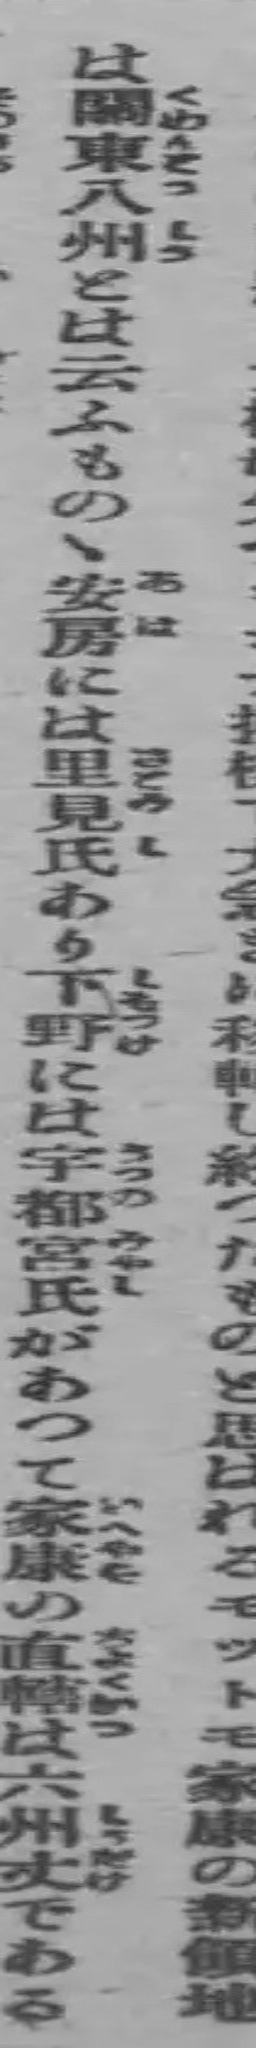は関東八州とは云ふものゝ安房には里見氏あり下野には宇都宮氏があつて家康の直轄は六州丈である
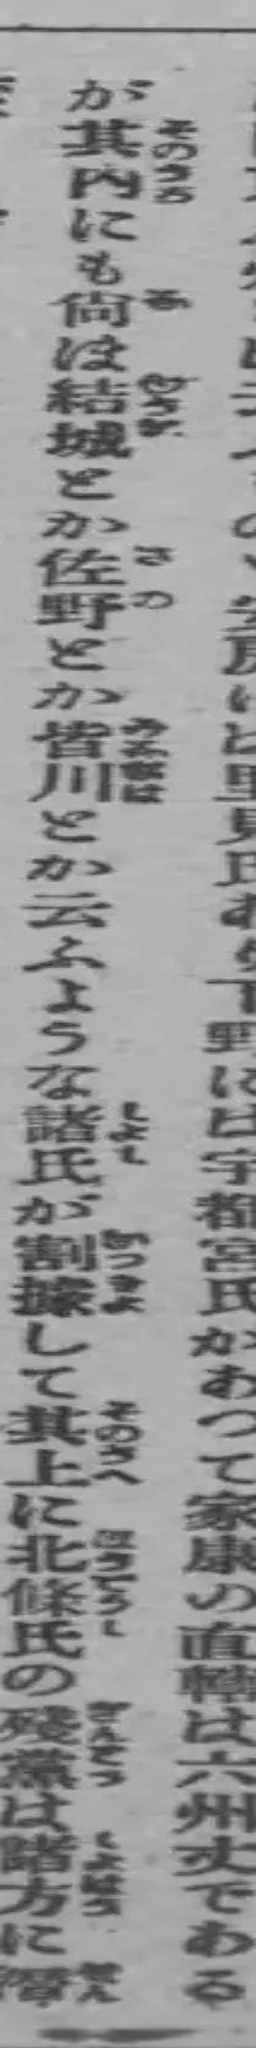が其内にも尚ほ結城とか佐野とか皆川とか云ふような諸氏が割拠して其上に北條氏の残党は諸方に潜
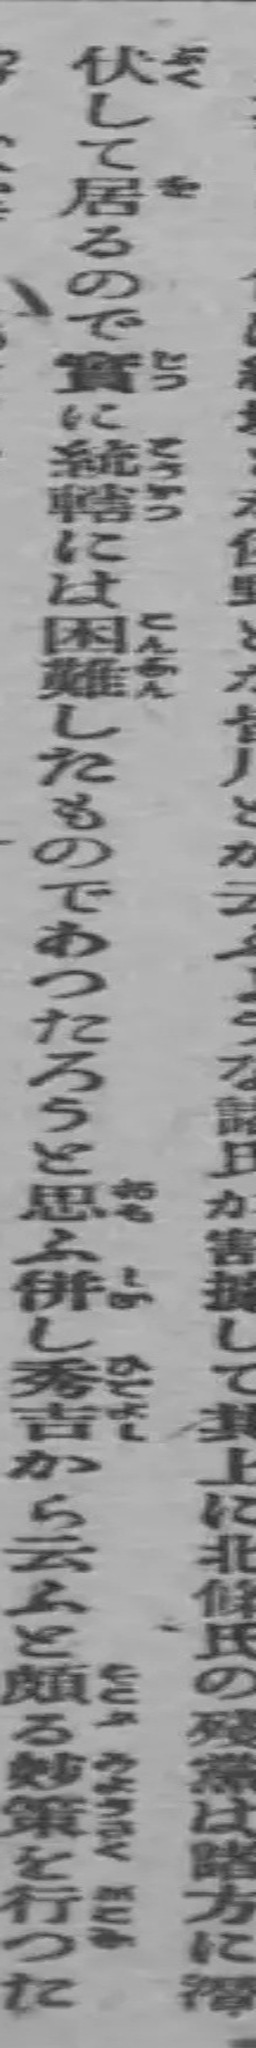伏して居るので実に統括には困難したものであつたろうと思ふ併し秀吉から云ふと頗る妙策を行つた
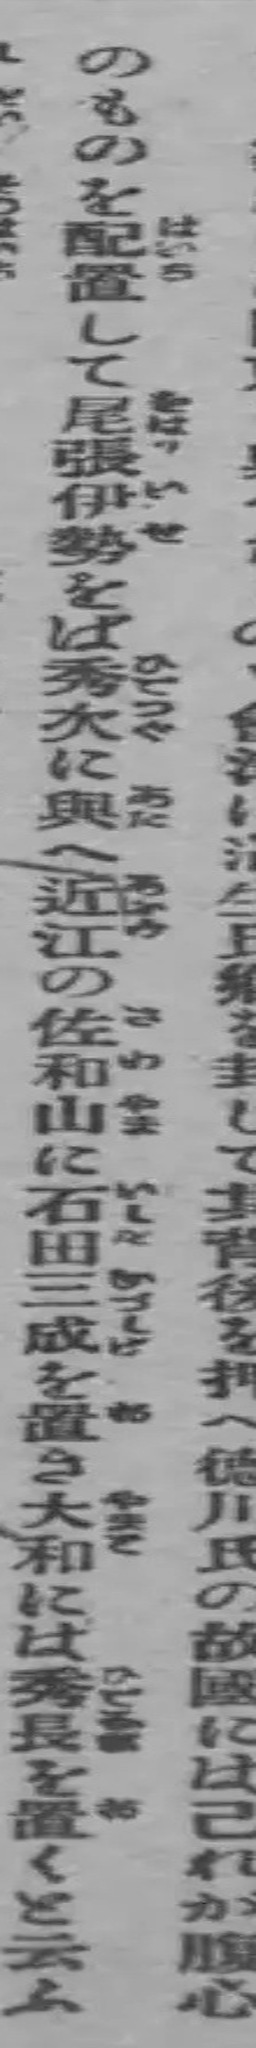のものを配置して尾張伊勢をば秀次に与へ近江の佐和山に石田三成を置き大和には秀長を置くと云ふ
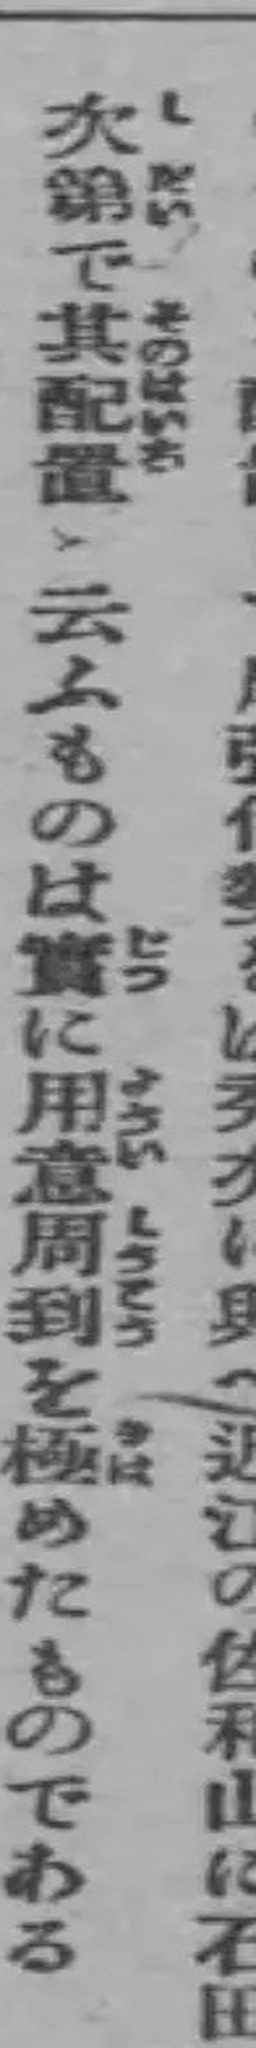次第で其配置と云ふものは実に用意周到を極めたものである
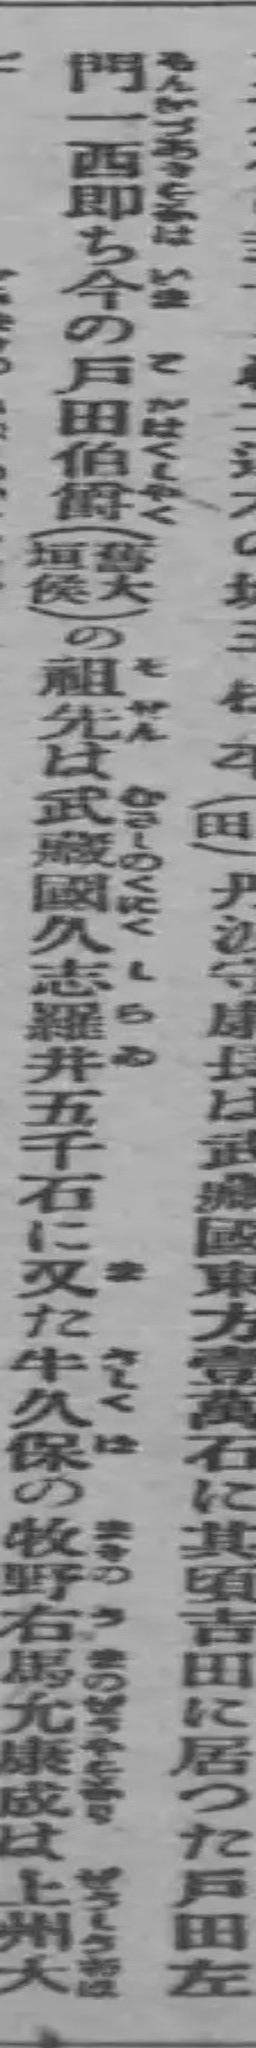門一西即ち今の戸田伯爵(旧大垣侯)の祖先は武蔵国久志羅井五千石に又た牛久保の牧野右馬允康成は上州大
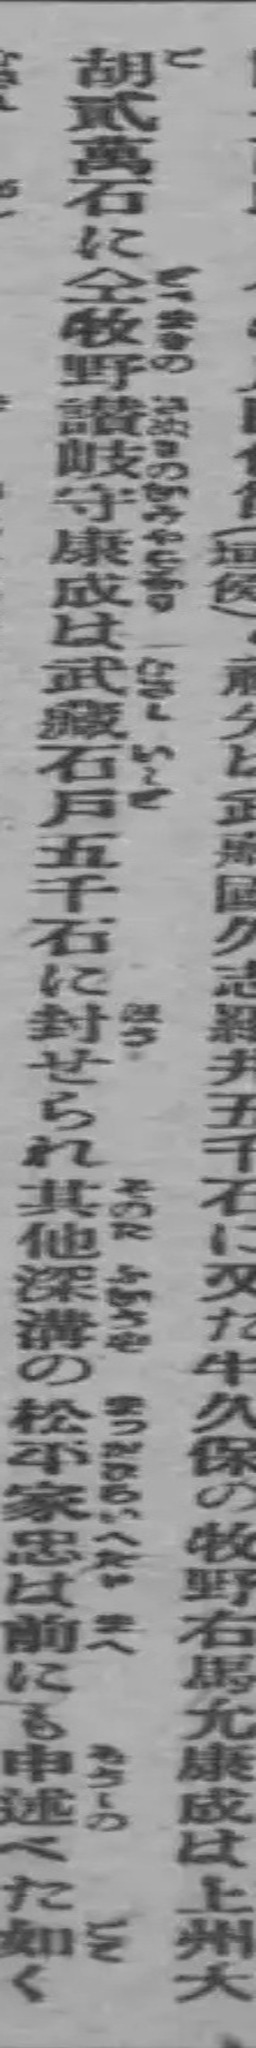胡弐万石に仝牧野讃岐守康成は武蔵石戸五千石に封せられ其他深溝の松平家忠は前にも申述べた如く
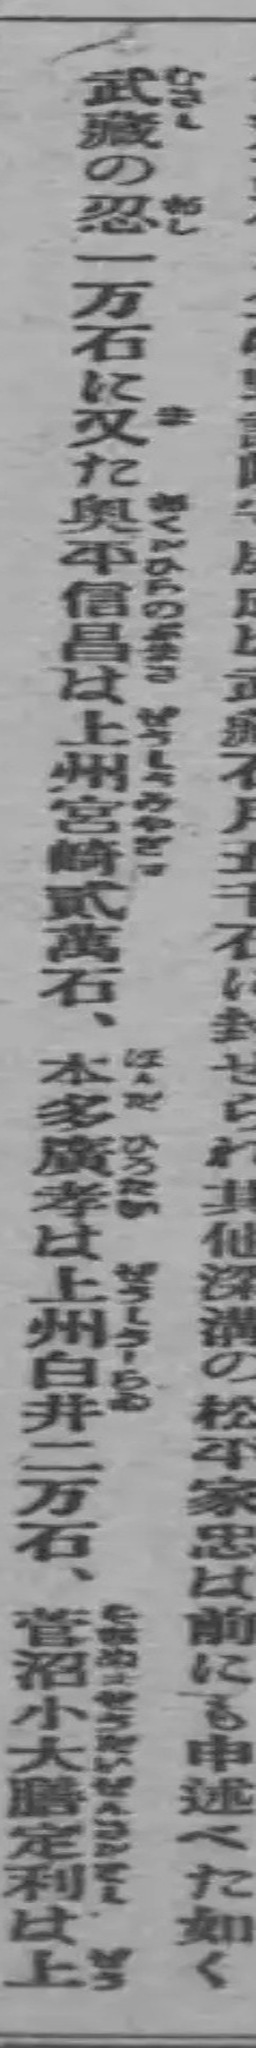武蔵の忍一万石に又た奥平信昌は上州宮崎弐万石、本多広孝は上州白井二万石、菅沼小大膳定利は上
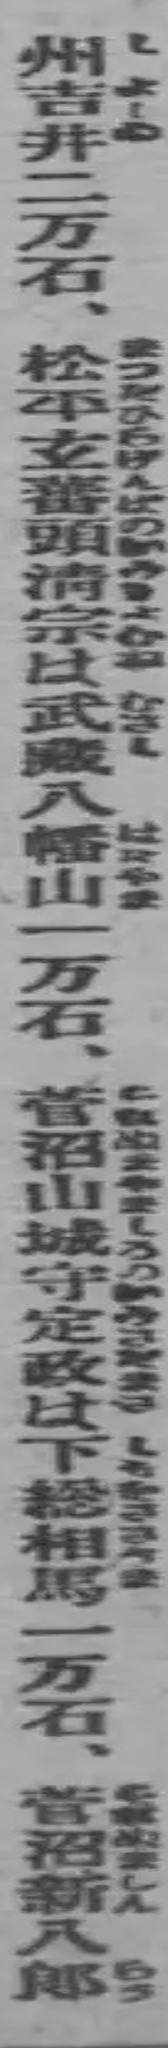州吉井二万石、松平玄蕃頭清宗は武蔵八幡山一万石、菅沼山城守定政は下総相馬一万石、菅沼新八郎
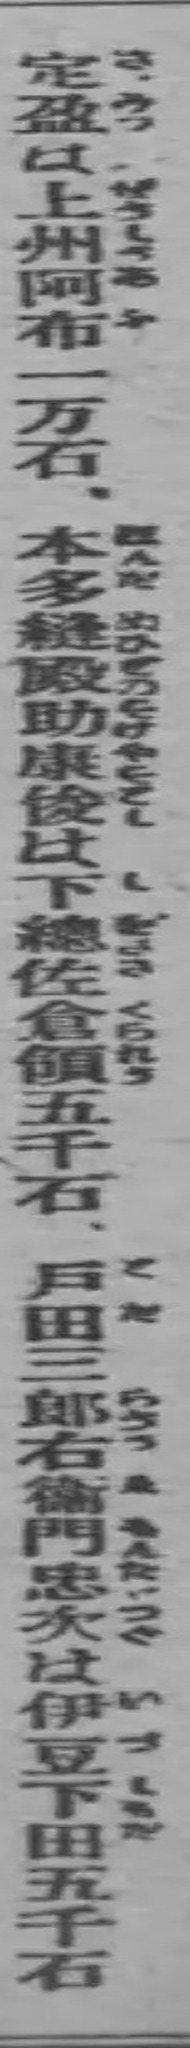定盈は上州阿布一万石、本多縫殿助康俊は下総佐倉領五千石、戸田三郎右衛門忠次は伊豆下田五千石
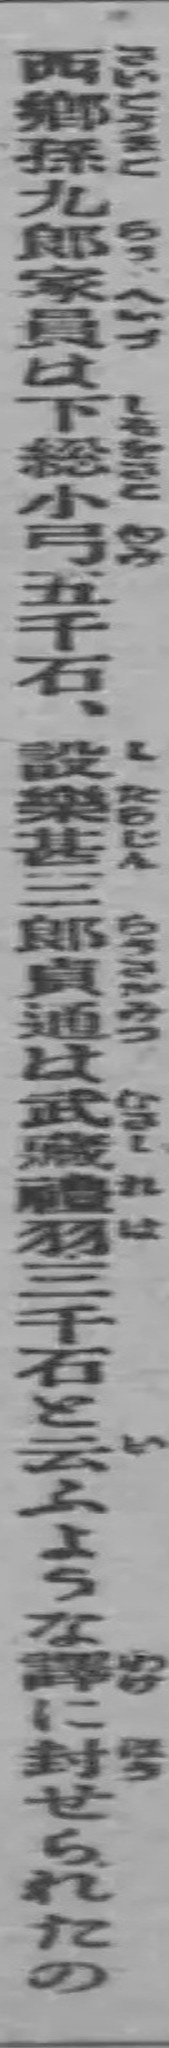西郷孫九郎家員は下総小弓五千石、設楽甚三郎貞通は武蔵礼羽三千石と云ふような訳に封せられたの
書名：豊橋市史談
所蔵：国立国会図書館 National Diet Library, JAPAN
